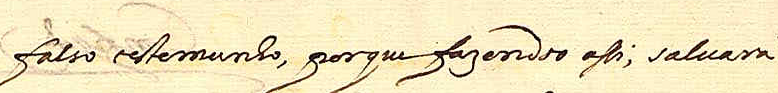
falso testemunho, porque fazendoo assi, saluara
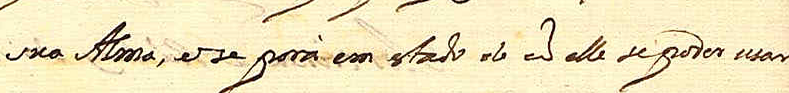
sua Alma, e se porà em estado de cō elle se poder usar
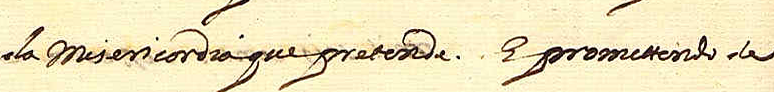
da Misericordia que pretende. E promettendo de
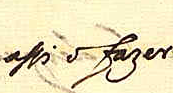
assi o fazer
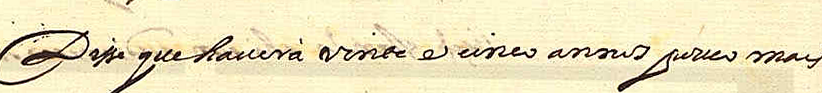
Disse que hauerà vinte e cinco annos pouco mais
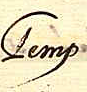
Temp.
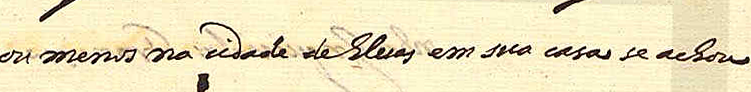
ou menos na cidade de Eluas em sua casa se achou
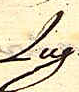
Lug.
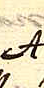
A
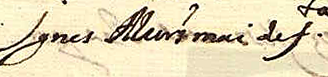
Jgnes Alurs̄ mai defta.
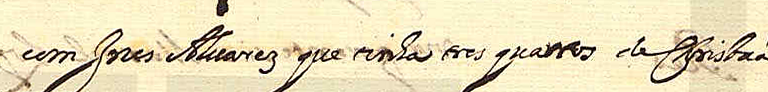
com Jnes Aluarez que tinha tres quartos de Christaā
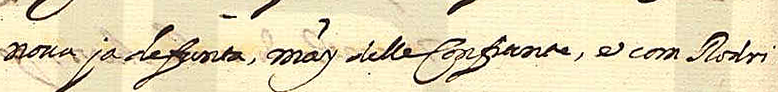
noua ja defunta, mãy delle Confitente, e com Rodri
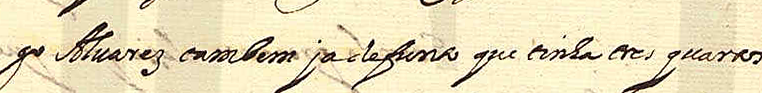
go Aluarez tambem ja defunto que tinha tres quartos
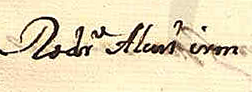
Rodro Alurs̄ irm
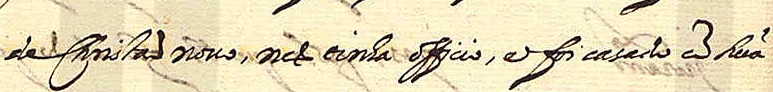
de Christaõ nouo, naõ tinha officio, e foi casado cō huā
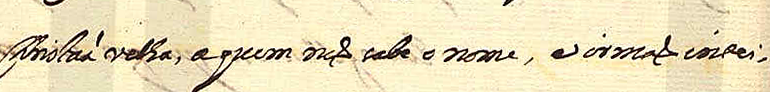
Christaā velha, a quem não sabe o nome, e irmaõ intei
